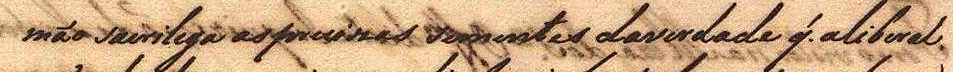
maõ sacrilega as precizas sementes da verdade q̄ a liberal
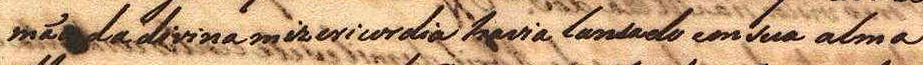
mã_ da divina mizericordia havia lansado em sua alma
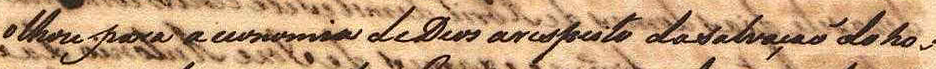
olhou para a economia de Deos a respeito da salvaçaõ do ho
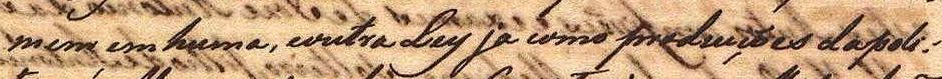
mem em huma, e outra Ley já como producções da poli
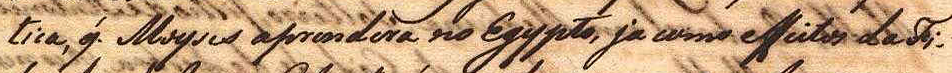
lica, q̄ Moyses aprendera no Egypto, ja como effeitos da Fi
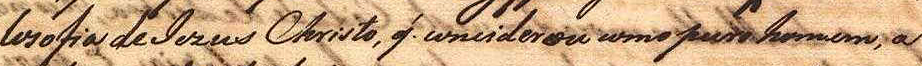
lesofia de Iezus Christo, q̄ conciderou como puro homem, a
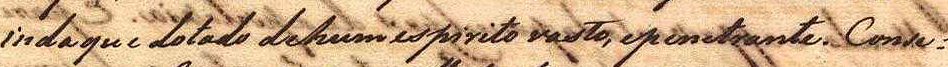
inda que dotado de hum espirito vasto, e penetrante. Conse
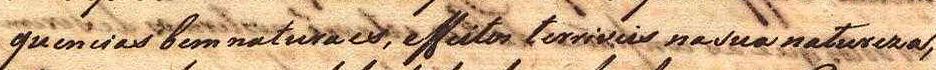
quencias bem naturaes, effeitos terriveis na sua natureza,
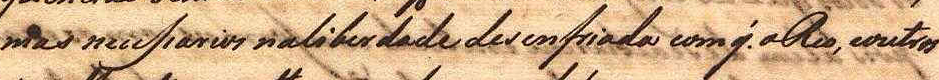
mas necessarios na liberdade desenfriada com q̄ o Reo, e outros
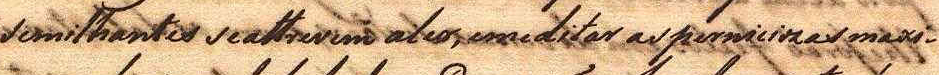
semilhantes se attrevem a ler, e meditar as perniciozas maxi
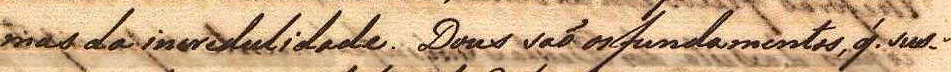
mas da incredulidade. Dous saõ os fundamentos, q̄ sus
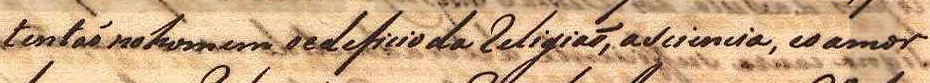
tentaõ no homem o edeficio da Religiaõ, a sciencia, e o amor
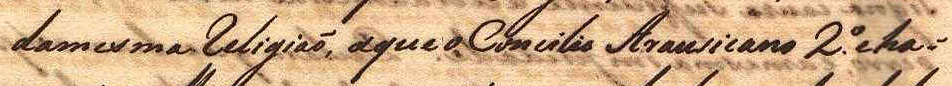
da mesma Religiaõ, a que o Concilio Arausicano 2.o cha
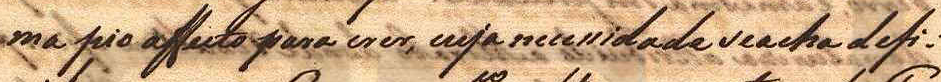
ma pio affecto para crer, cuja necessidade se acha defi
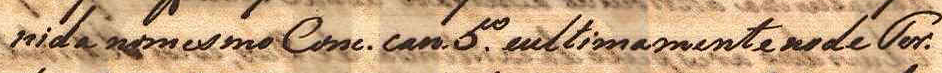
nida no mesmo Conc. can. 5.o e ultimamente no de Ter.
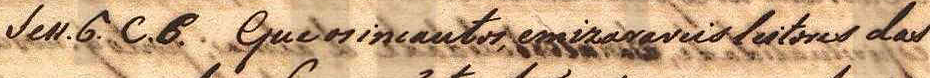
sess. 6. C.6. Que os incautos, e mizaraveis leitores das
